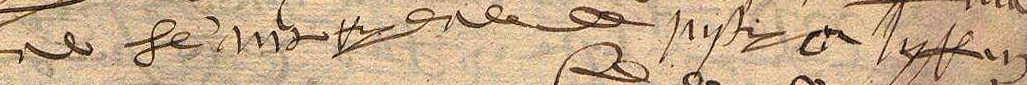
dado he autorRydade de justyça vyRem
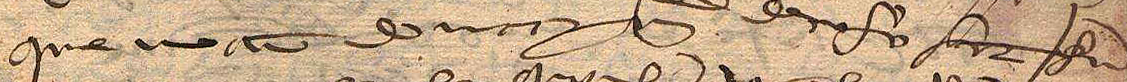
que no nāo do nacymto de nosso sōr Jhū
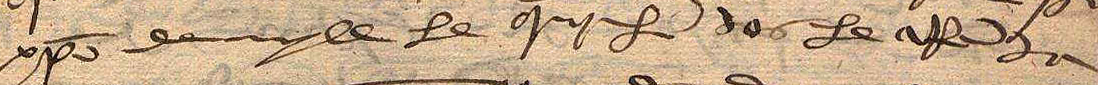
xp̄o de myll he quynhētos he coRēta
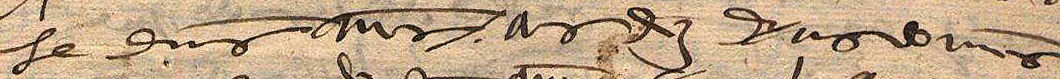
he dous an̄os/. aos dez dyas do mes
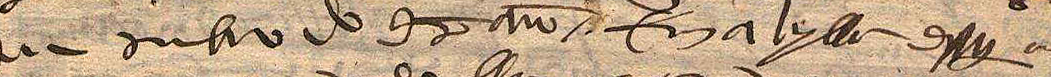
doutubro do dt̄o an̄o /. Em a vylla djsga
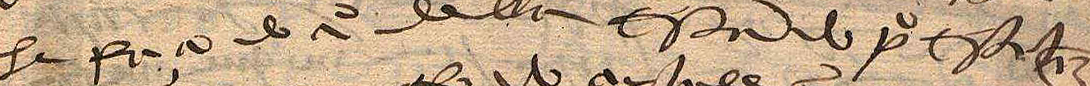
he paço do co della Estādo po Estevez
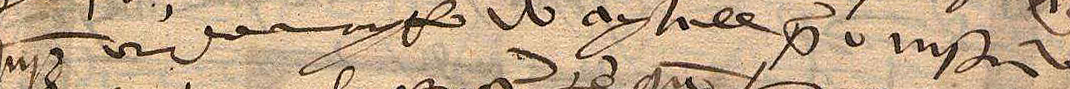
Juiz ordenayRo do cyvell p̄o o mstro
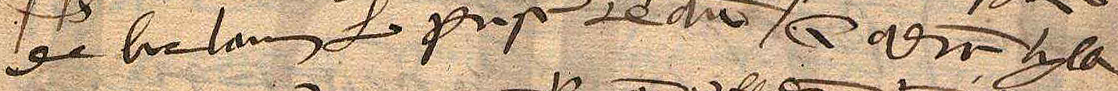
de lorvam ho presēte an̄o /. ē a dt̄a vylla
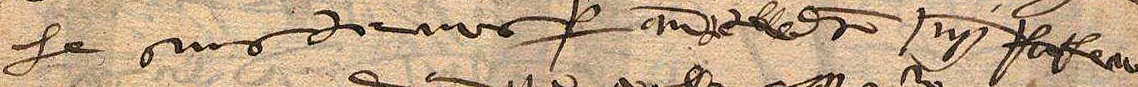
he seus termos ꝑante elle dt̄o jujz paReçeo
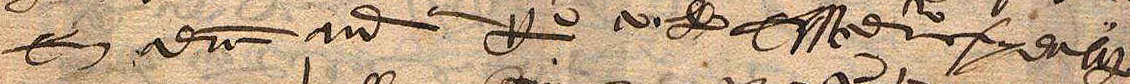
Em a dt̄a auda go coelho Esscodro e fydalgo
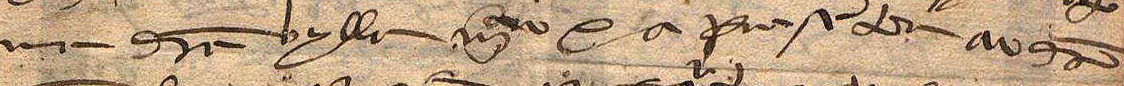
na dt̄a vylla mro e apresētou ao dt̄o
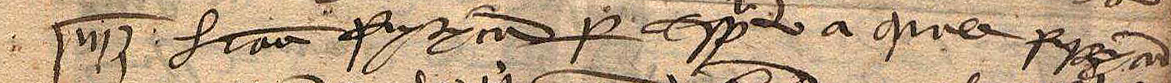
juiz hūaa pytyçā ꝑ Espito a quall pytycā
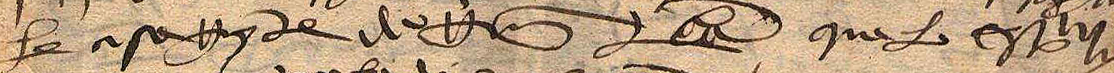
he a segȳte do gēz tbā que ho Espivy
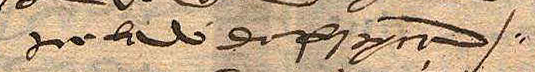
trelado da pjtyçā /:
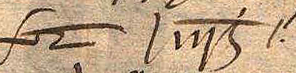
Sōr jujz /.
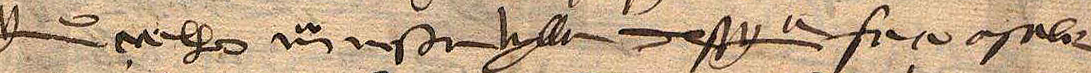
go coelho mro nesta vyla dessga faço a saber
